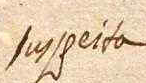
suspeita
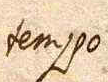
tempo
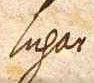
lugar
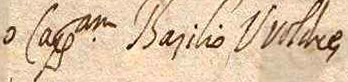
o Cap̄am. Basilio Vvoldres
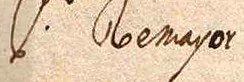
P.o Rocmayor
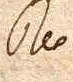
Reo
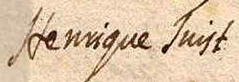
Henrique Tuist
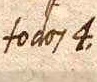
todos 4.
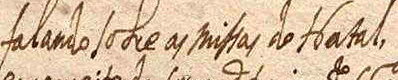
falando sobre as missas do Natal,
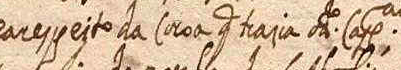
e a respeito da Coroa q̄ trasia o d̄o. Cap̄.am
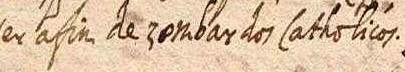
ser afim de zombar dos Catholicos.
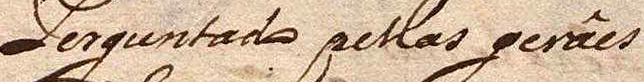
Perguntado pellas gerâes
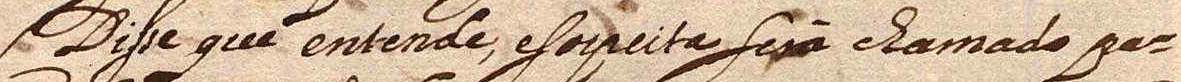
Disse que entende, e sospeita será chamado pa
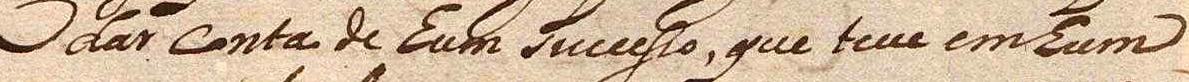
dar conta de hum successo, que teue em hum
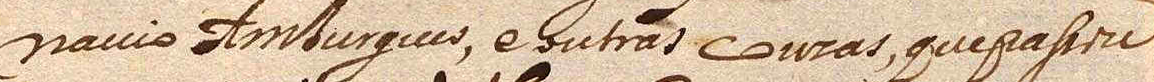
nauio Amburgues, e outras couzas, que passou
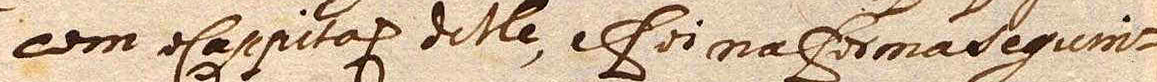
com o Cappitaõ delle, e foi na forma seguin
